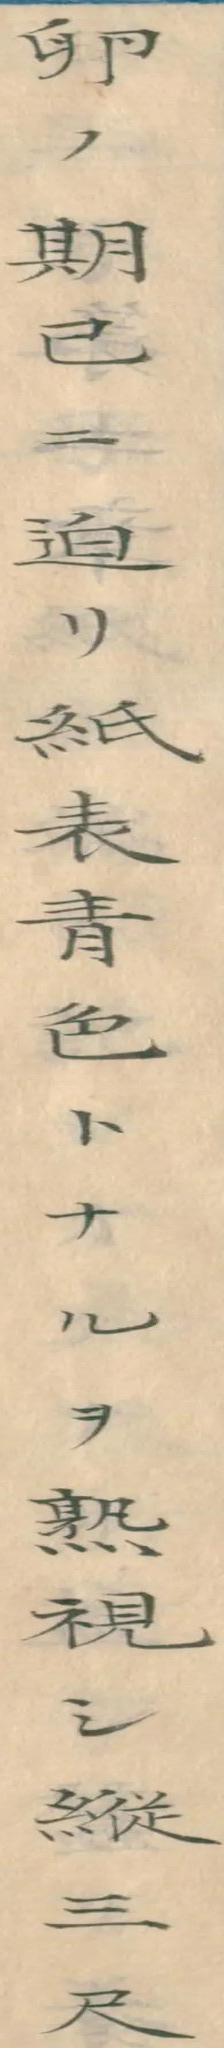卵ノ期已ニ迫リ紙表青色トナルヲ熟視シ縦三尺

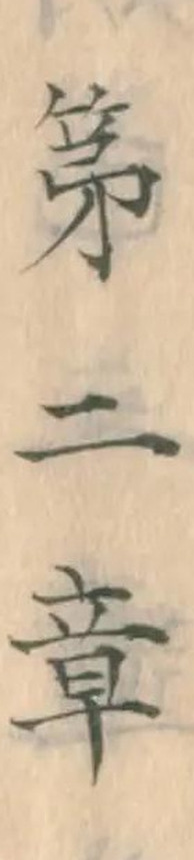第二章
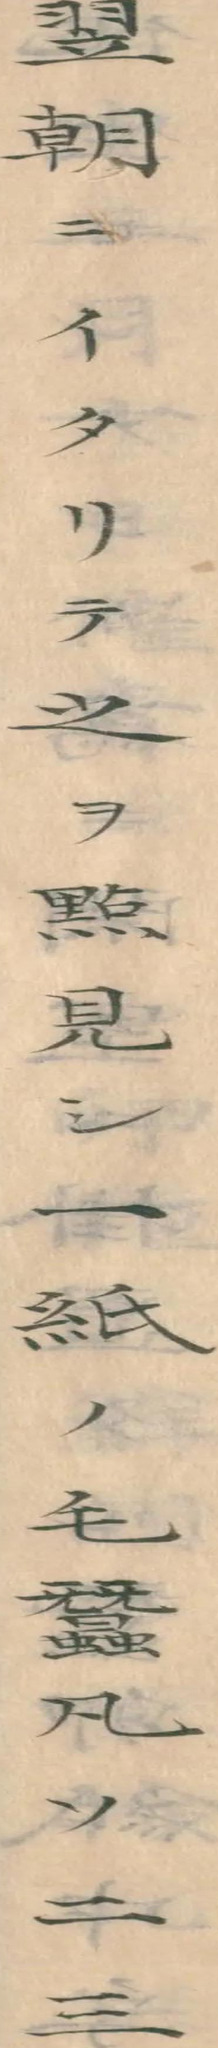翌朝ニイタリテ之ヲ点見シ一紙ノ毛蚕凡ソ二三
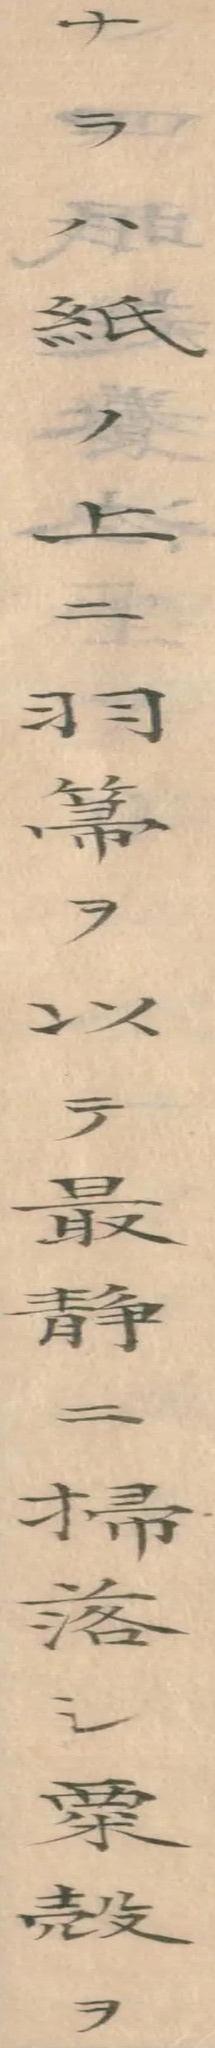ナラハ紙ノ上ニ羽箒ヲ以テ最静ニ掃落シ粟穀ヲ
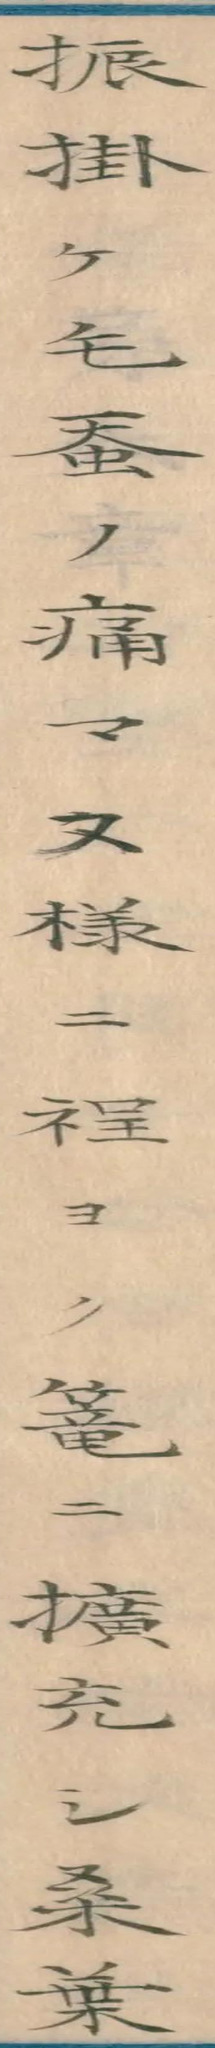振掛ケ毛蚕ノ痛マヌ様ニ程ヨク篭ニ拡充シ桑葉
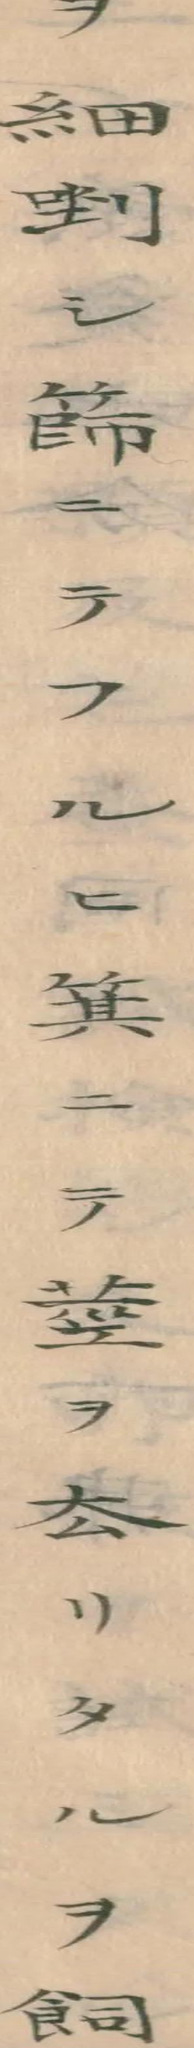ヲ細剉シ篩ニテフルヒ箕ニテ茎ヲ去リタルヲ飼
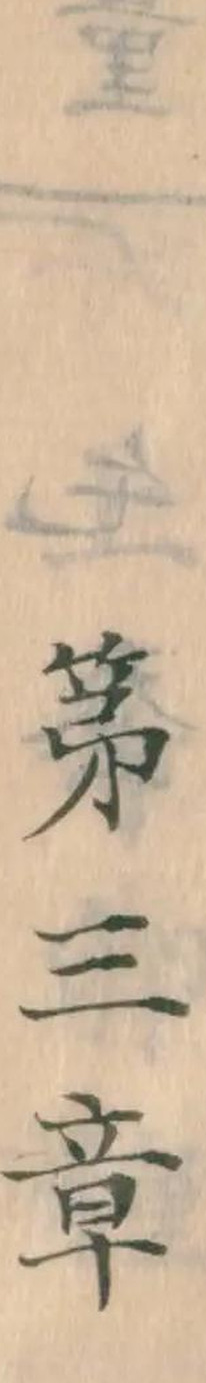第三章
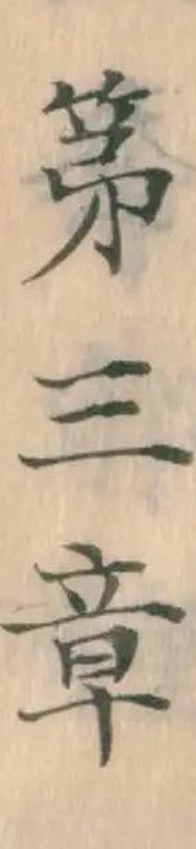第三章
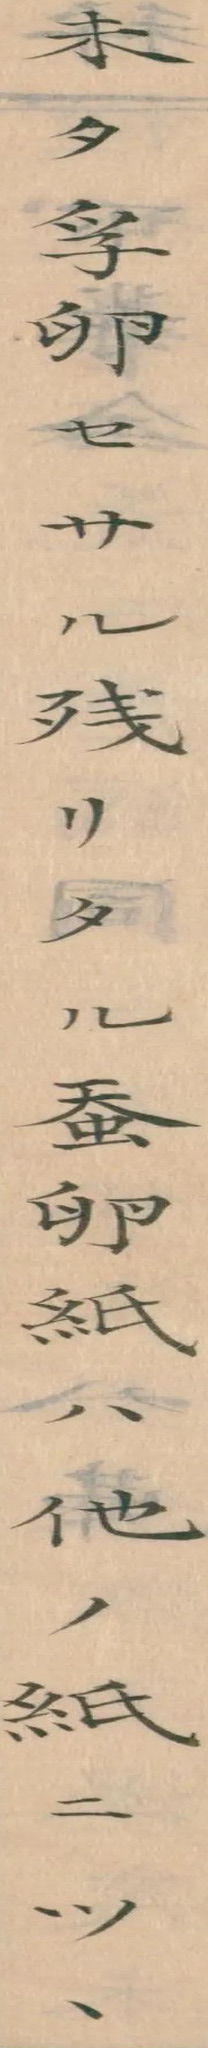未タ孚卵セサル残リタル蚕卵紙ハ他ノ紙ニツヽ
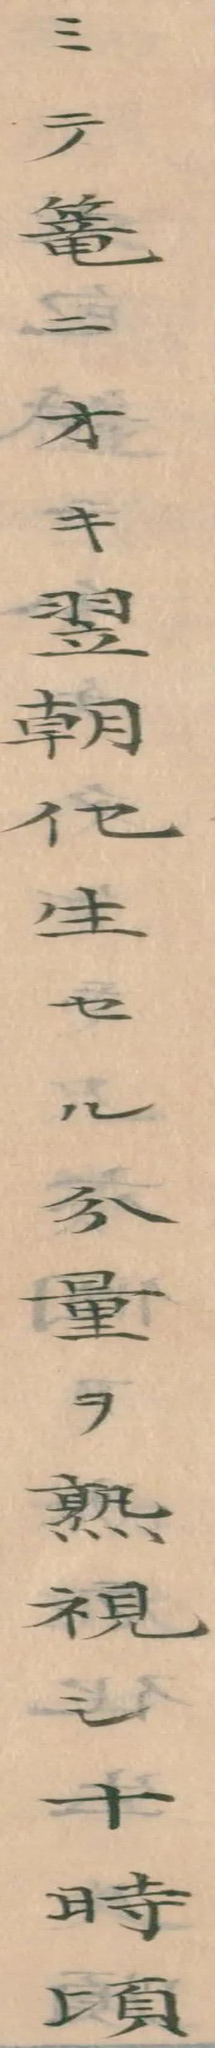ミテ篭ニオキ翌朝化生セル分量ヲ熟視シ十時頃
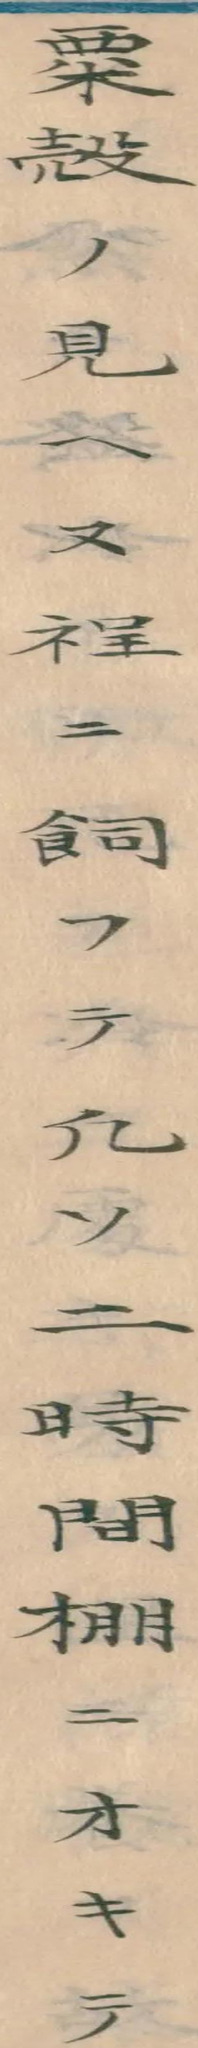粟穀ノ見ヘヌ程ニ飼フテ凡ソ二時間棚ニオキテ
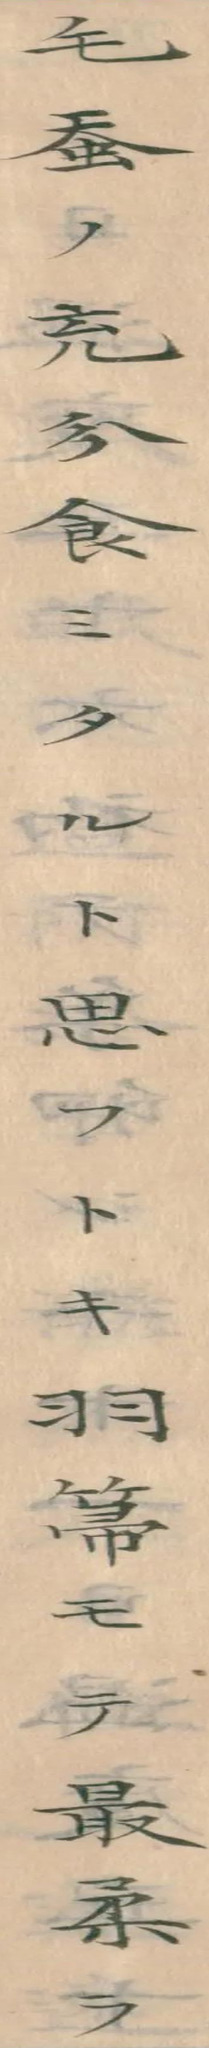毛蚕ノ充分食ミタルト思フトキ羽箒モテ最柔ラ
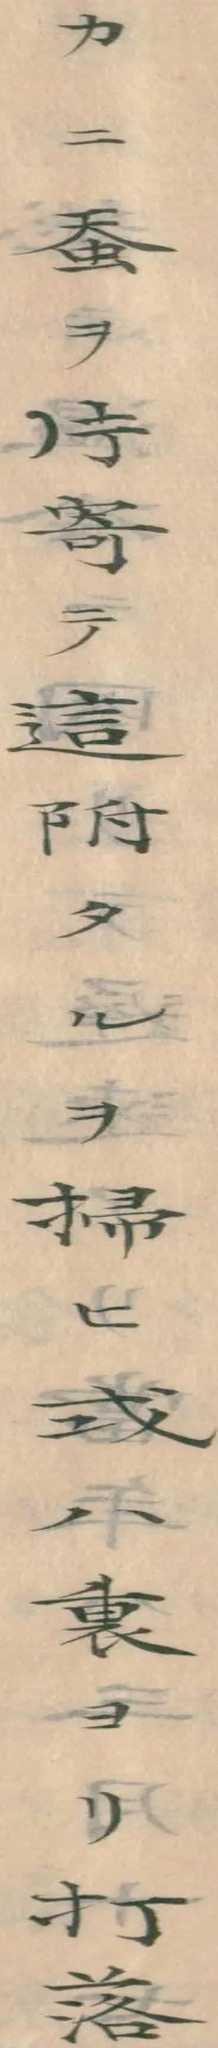カニ蚕ヲ片寄テ這附タルヲ掃ヒ或ハ裏ヨリ打落
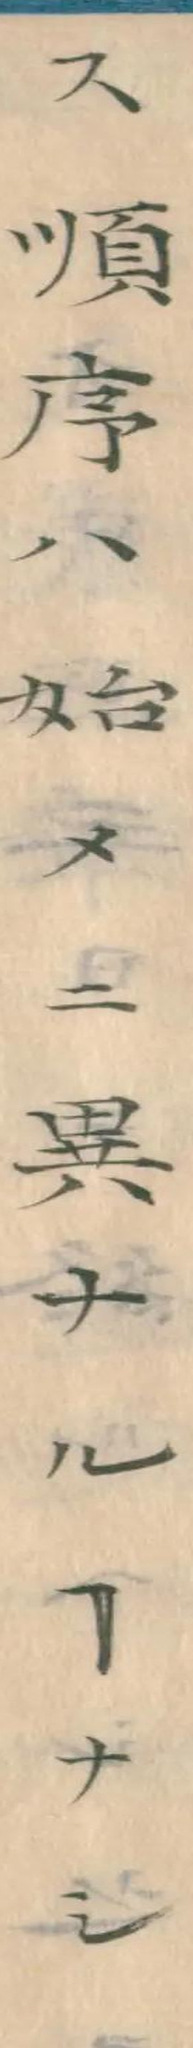ス順序ハ始メニ異ナルコトナシ
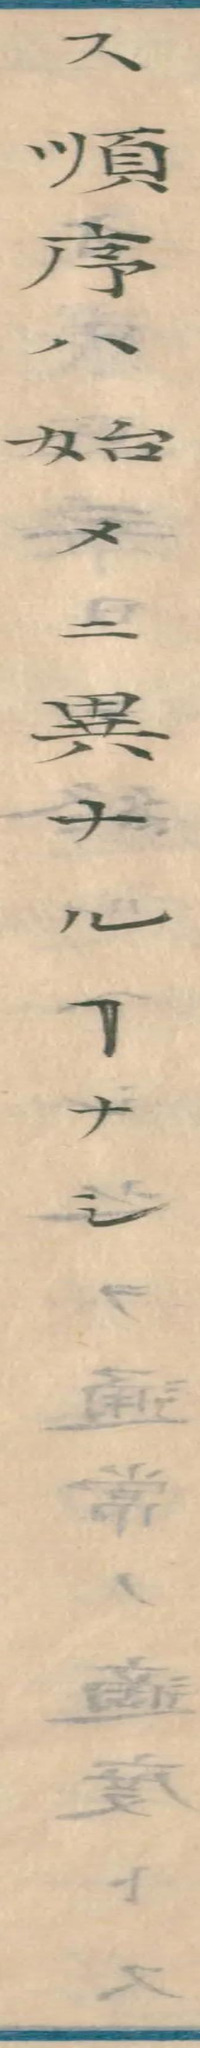ス順序ハ始メニ異ナルコトナシ
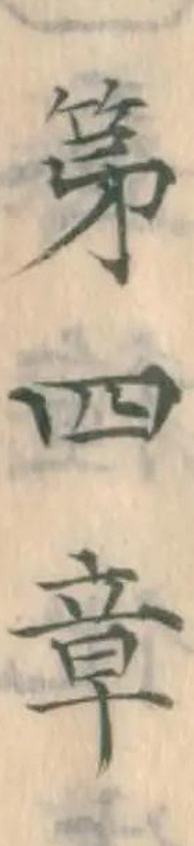第四章
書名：蚕桑集成
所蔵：国立国会図書館 National Diet Library, JAPAN
